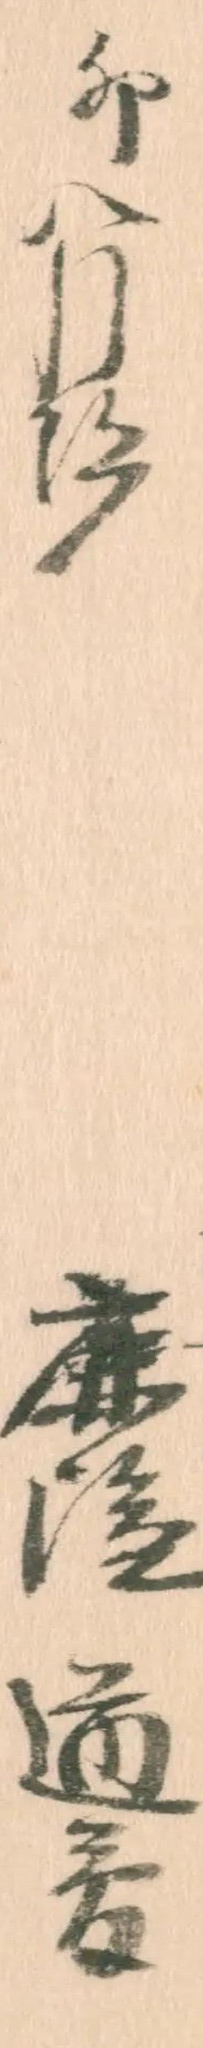卯八月朔日鹿塩道菅

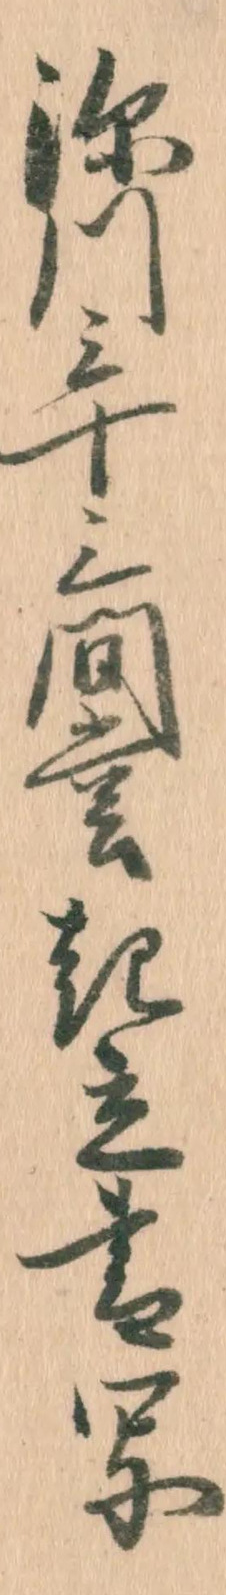深川三十三間堂起立書写

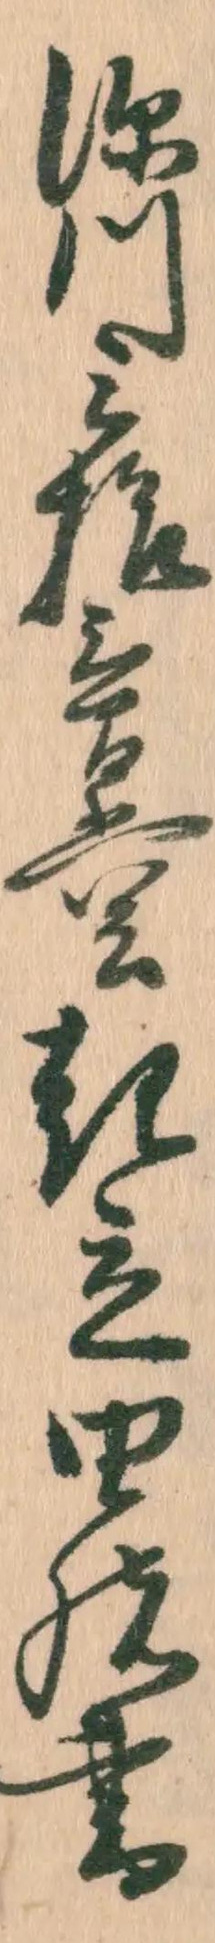深川三拾三間堂起立由緒書
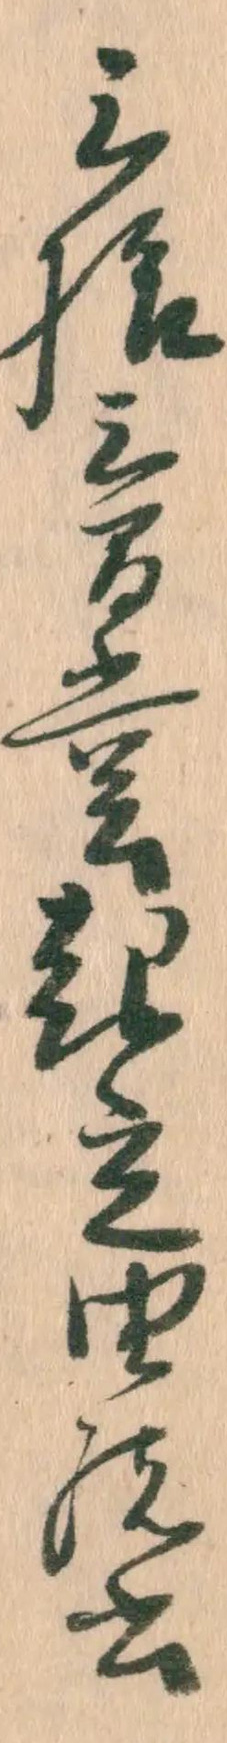三拾三間堂起立由緒書
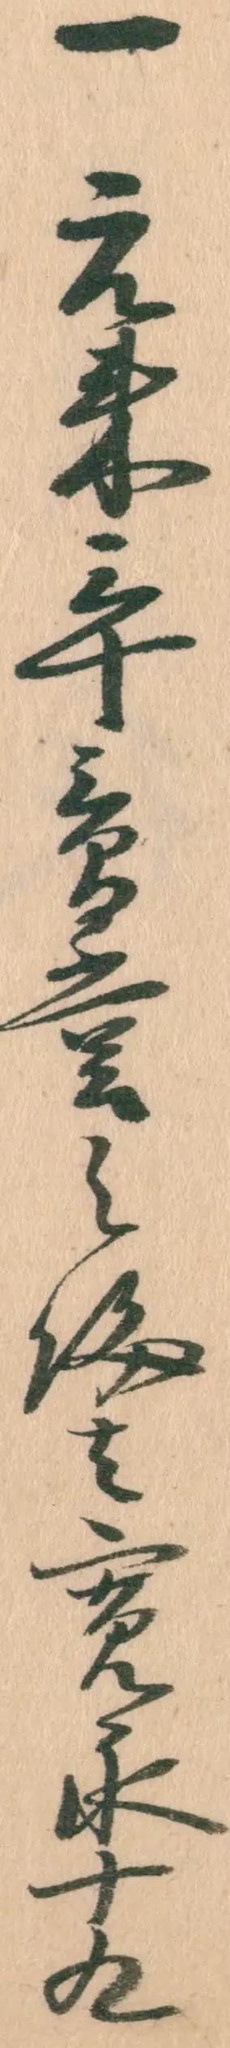一元来三十三間堂之儀は寛永十九
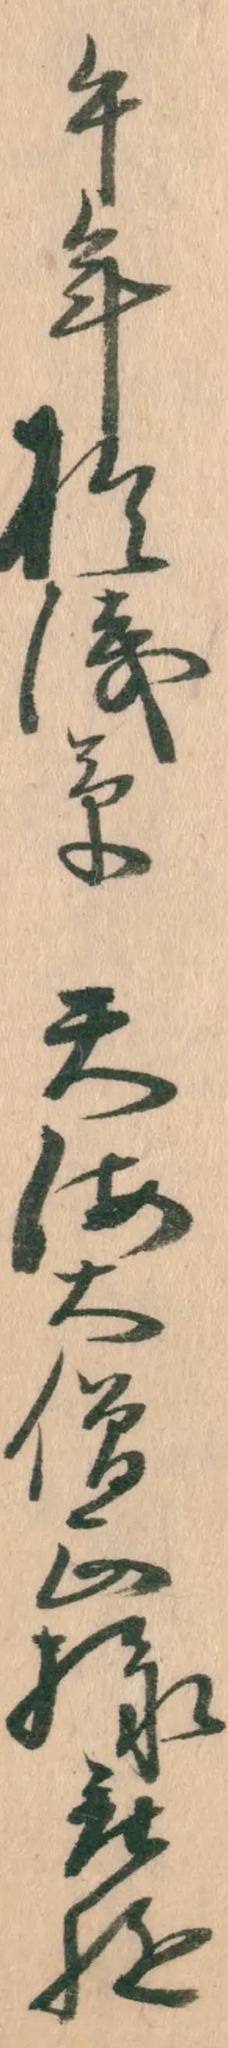午年於浅草天海大僧正様被遊

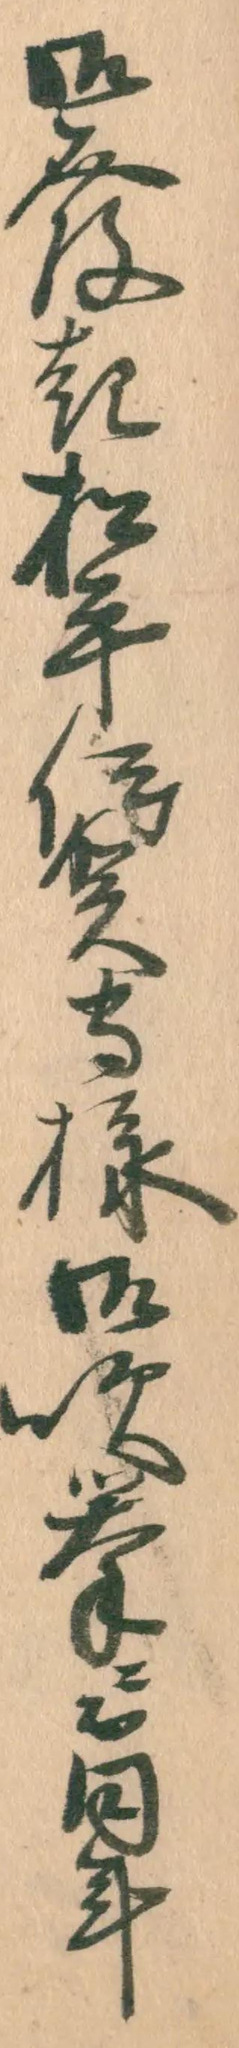御発起松平伊賀守様御吹挙に而同年
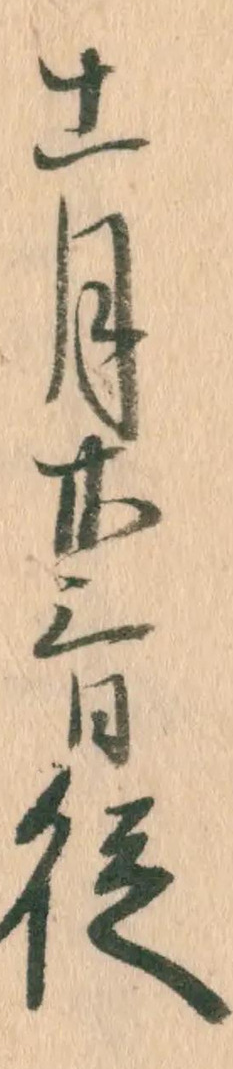十一月廿三日従
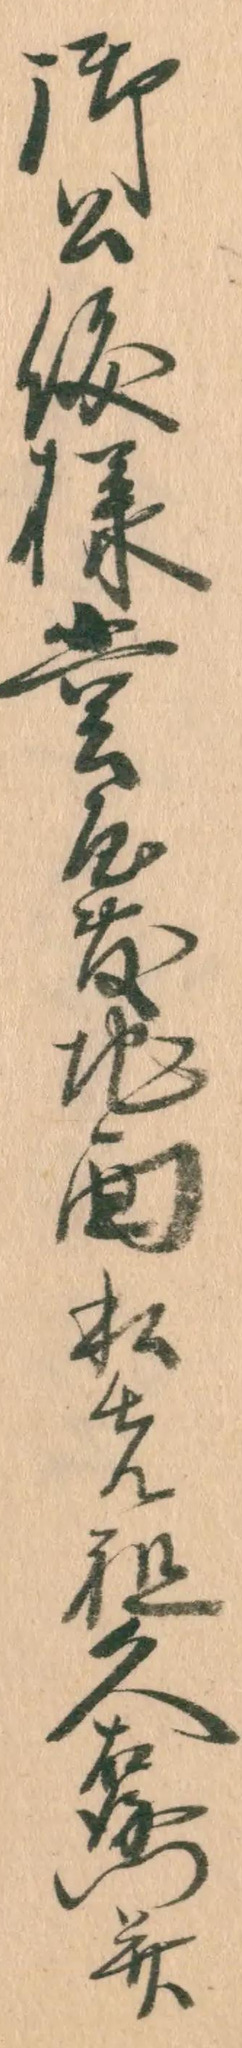御公儀様堂屋敷地面私先祖久右衛門并
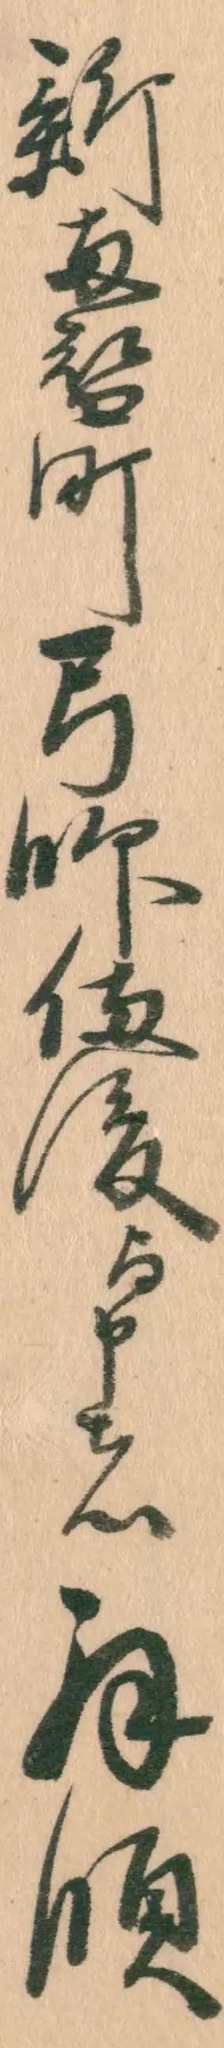新両替町弓師備後と申者拝領
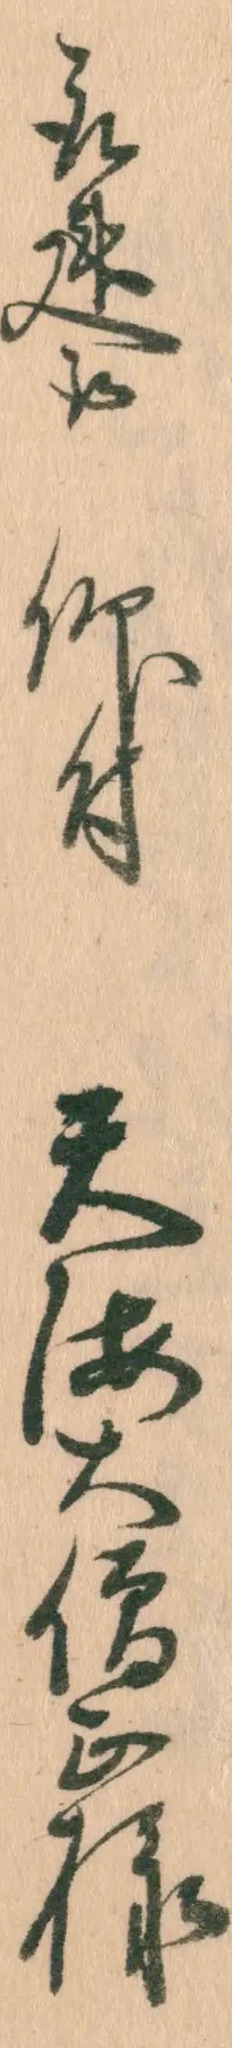取建被仰付天海大僧正様
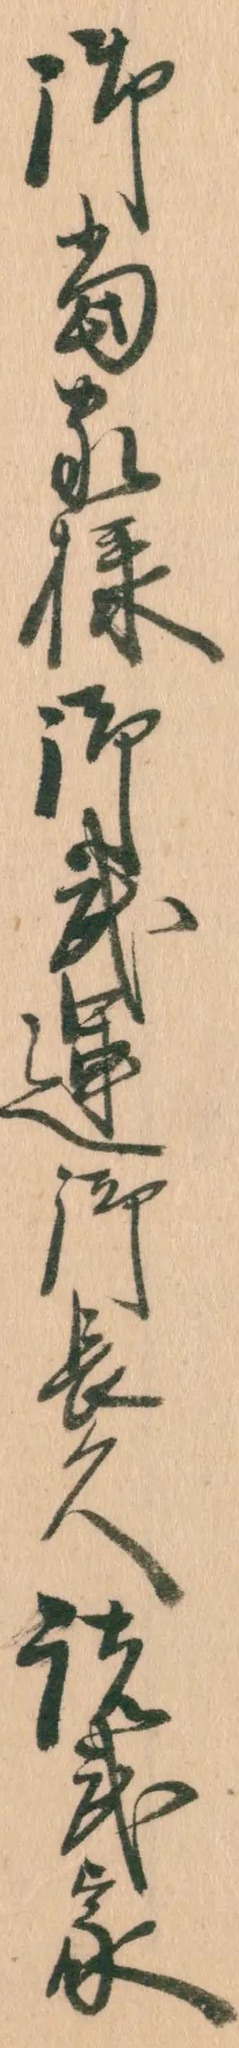御当家様御武運御長久諸武家
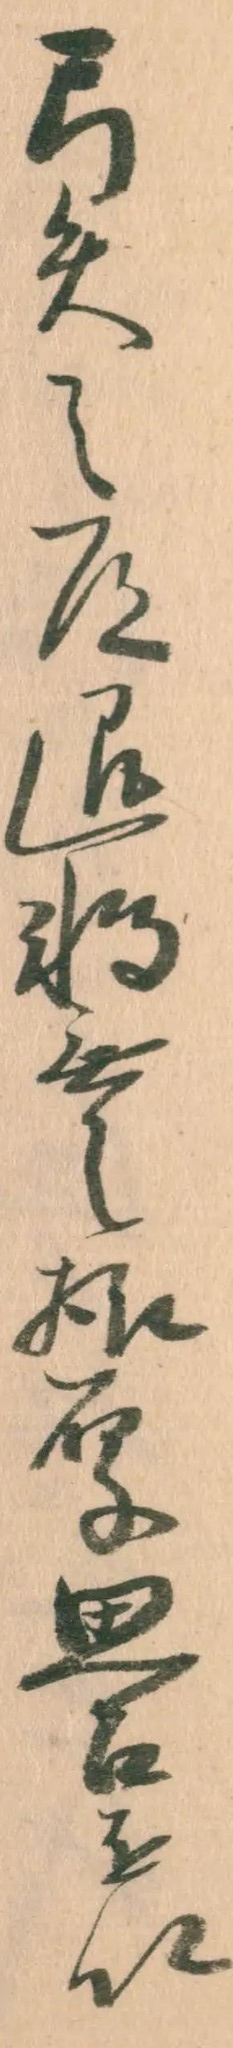弓矢之道退転無之様厚思召を以
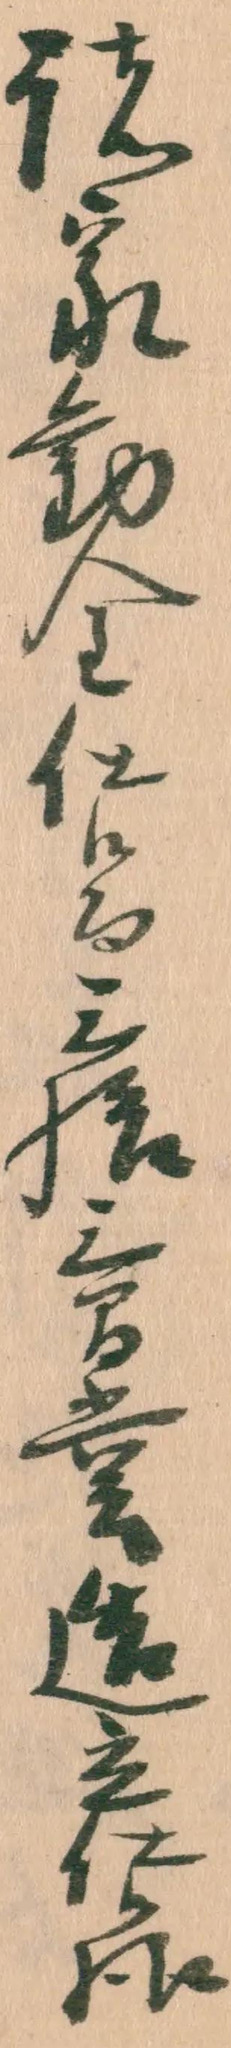諸家勧金仕候而三十三間堂造立仕候様
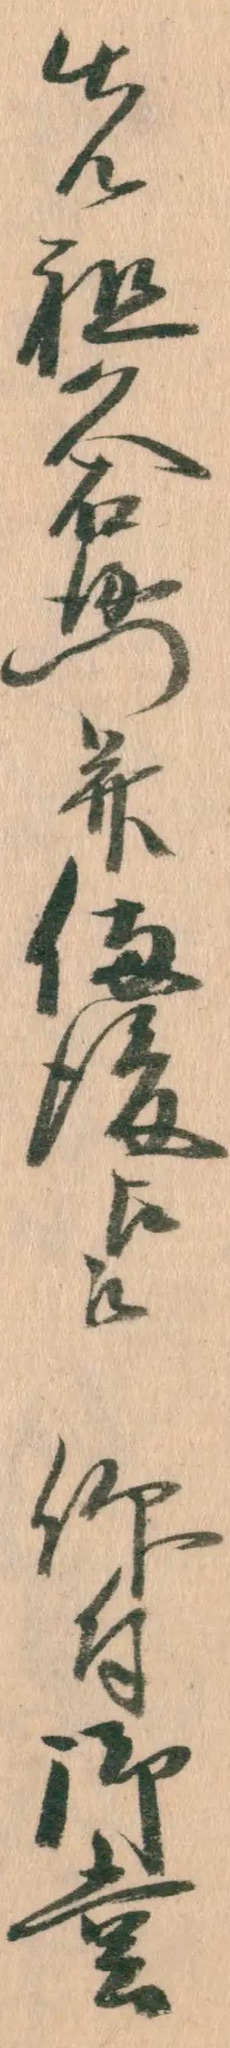先祖久右衛門并備後え被仰付御堂
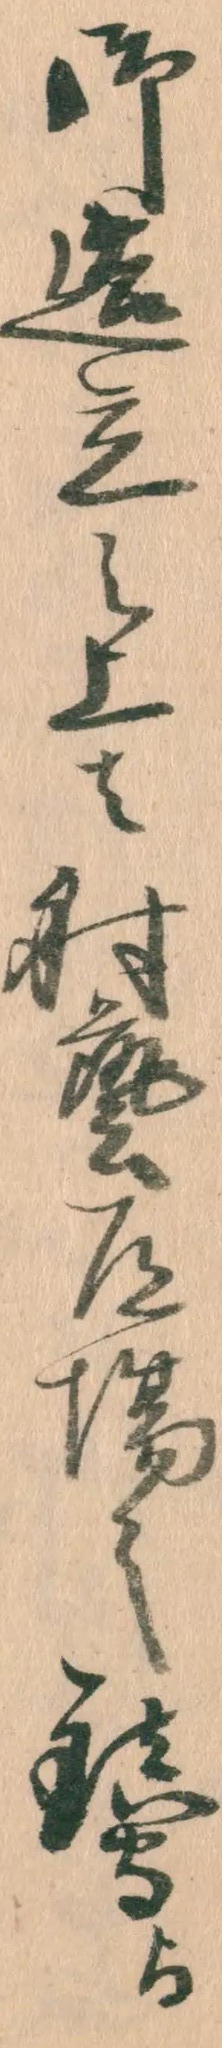御造立之上は射芸道場之鎮守と
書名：三十三間堂. [1]
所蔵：国立国会図書館 National Diet Library, JAPAN
